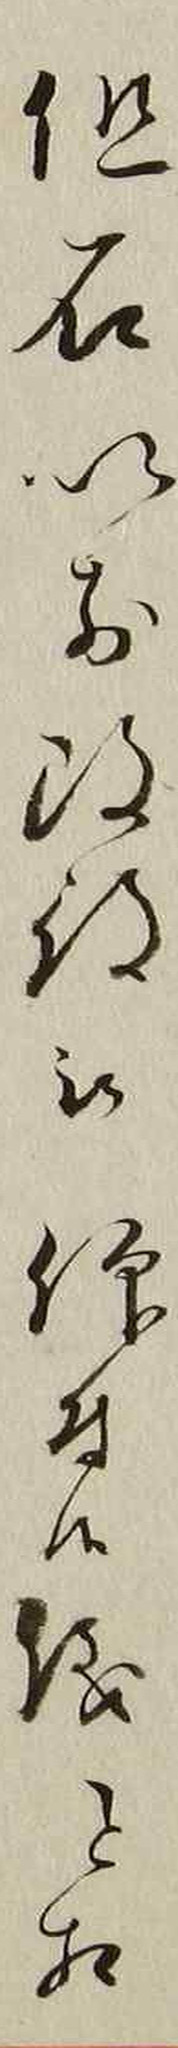但右以前改役被仰付候儀と相
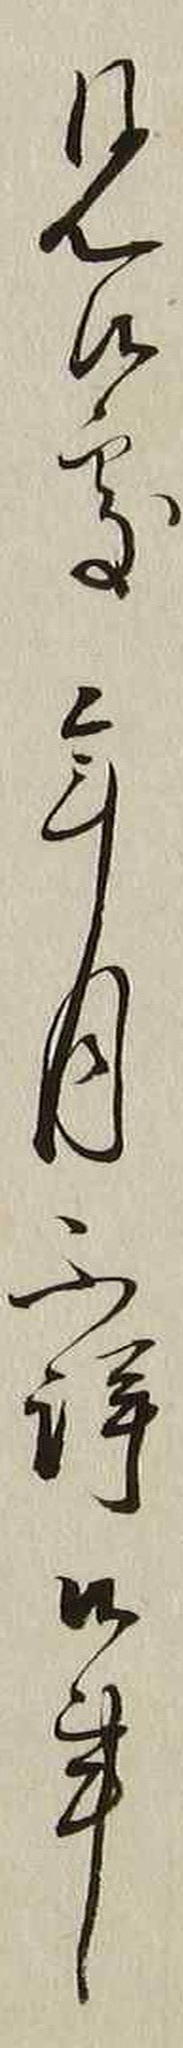見候処年月不詳候事
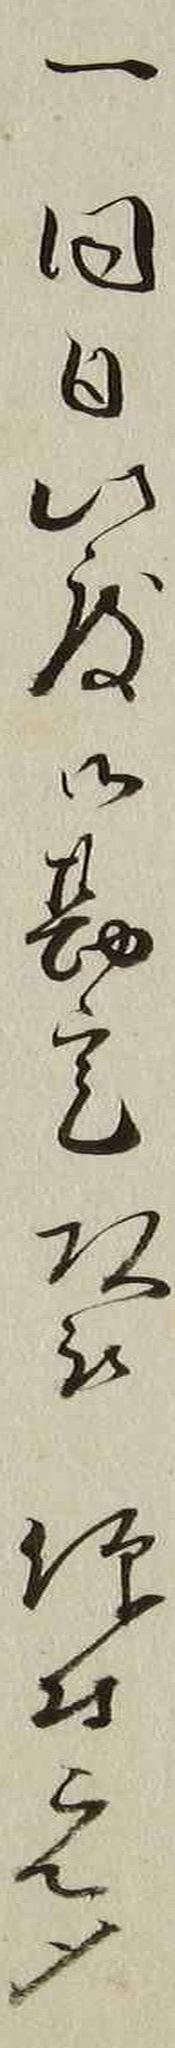一同日此度御勘定頭被仰付元〆
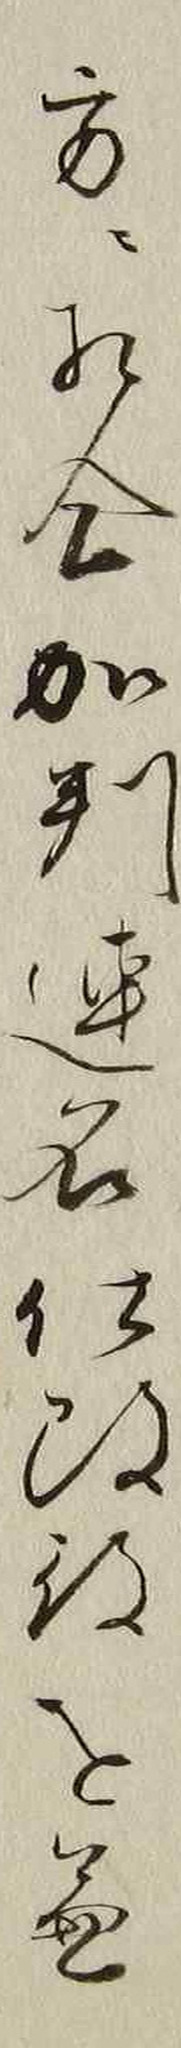方に相合加判連名仕改役を兼
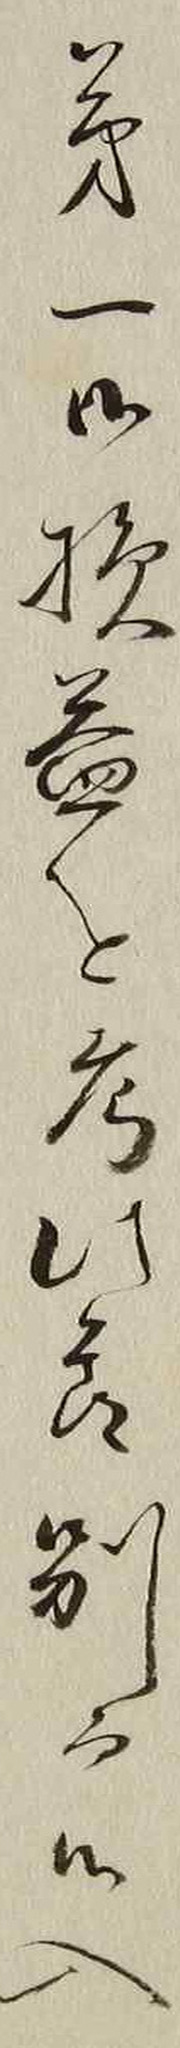第一御損益を考此節別而御入
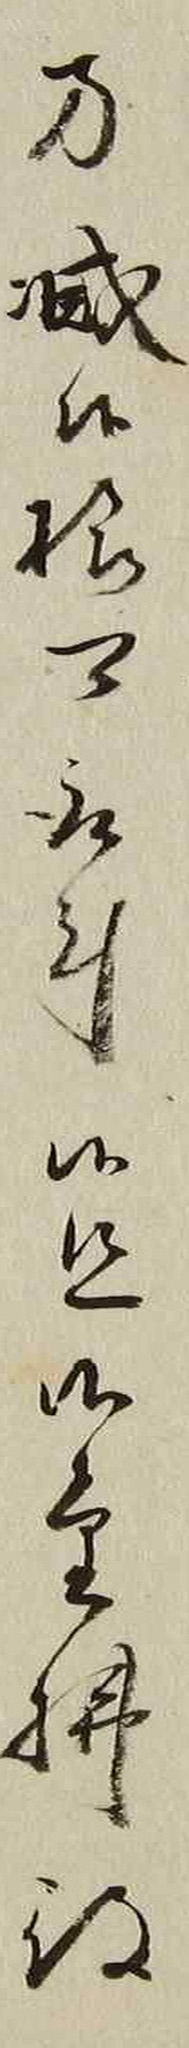方減候様可取計候且御金払役
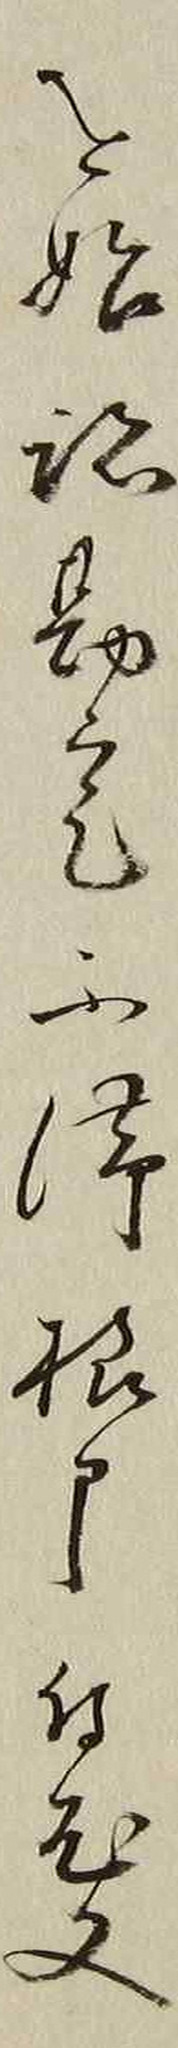を始跡勘定不滞様申付尤又
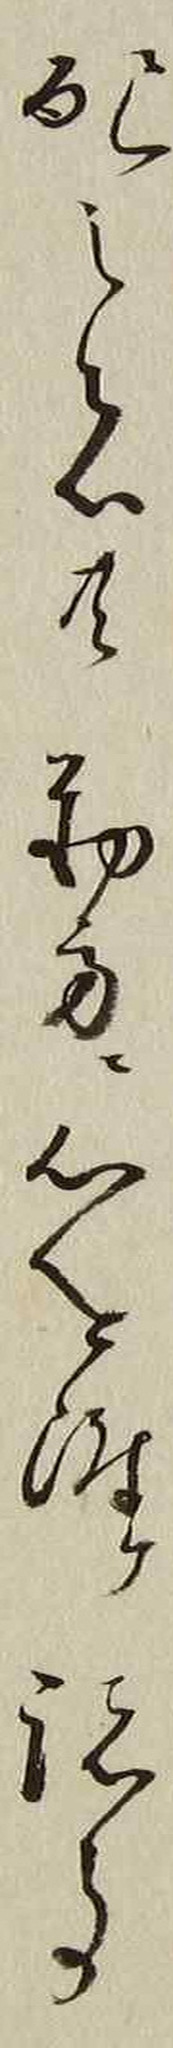配之者共勤方に心を附け諸事
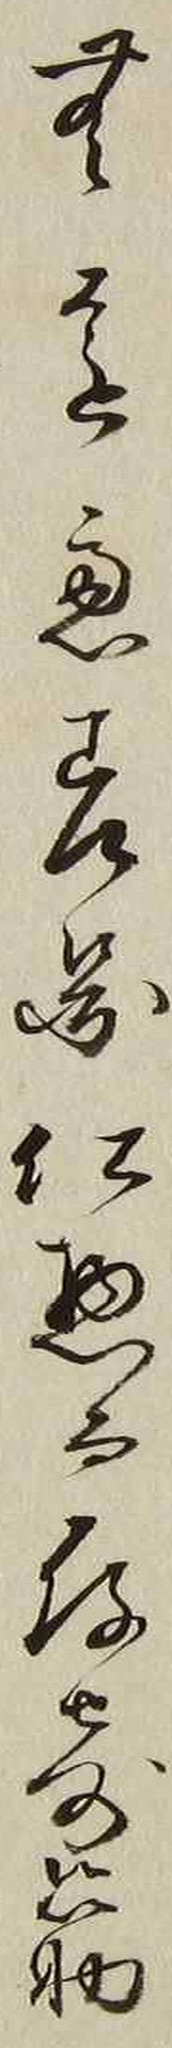無遠慮差図仕惣而存寄候筋
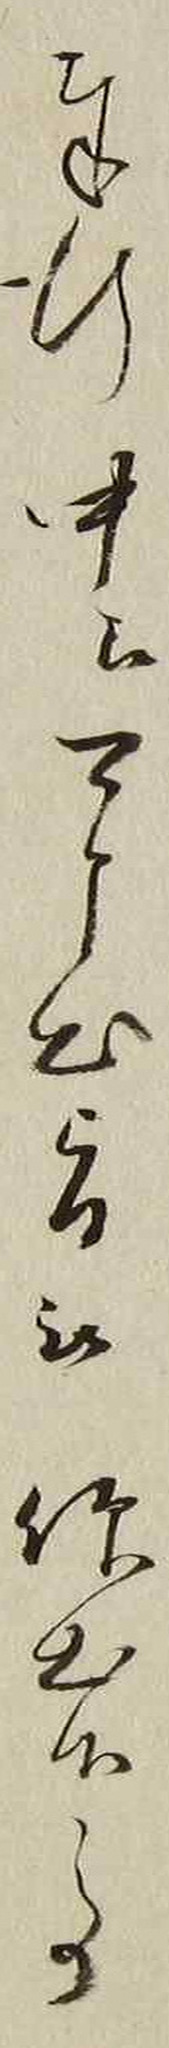奉行中え可申出旨被仰出候事
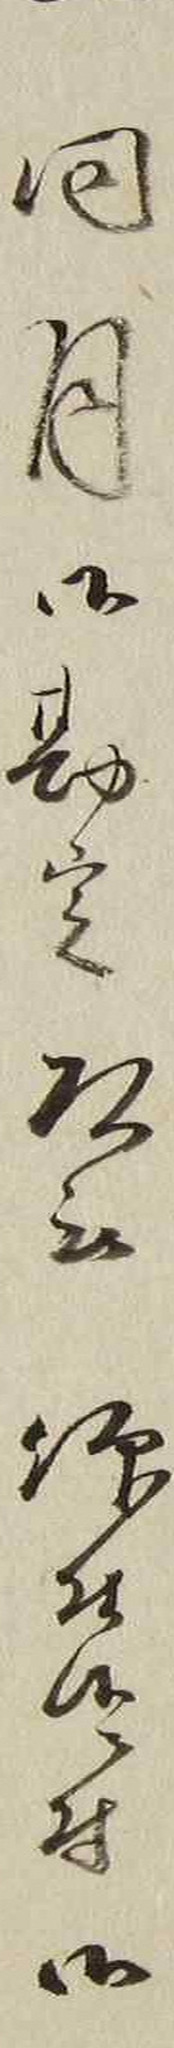一同月御勘定頭被仰付候に付御
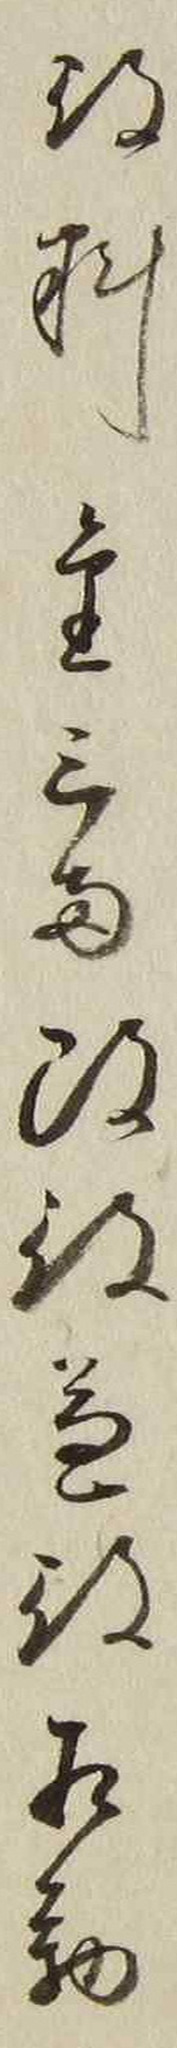役料金三両改役兼役相勤
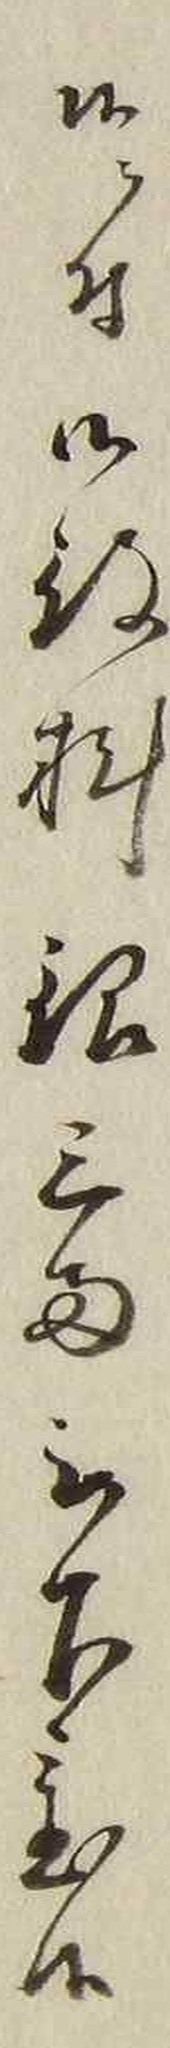候に付御役料銀三両被下置候
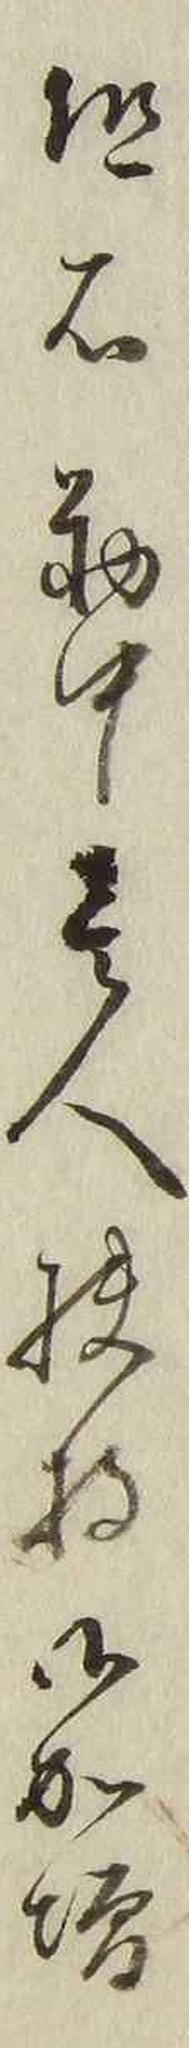但右勤中壱人扶持御加増
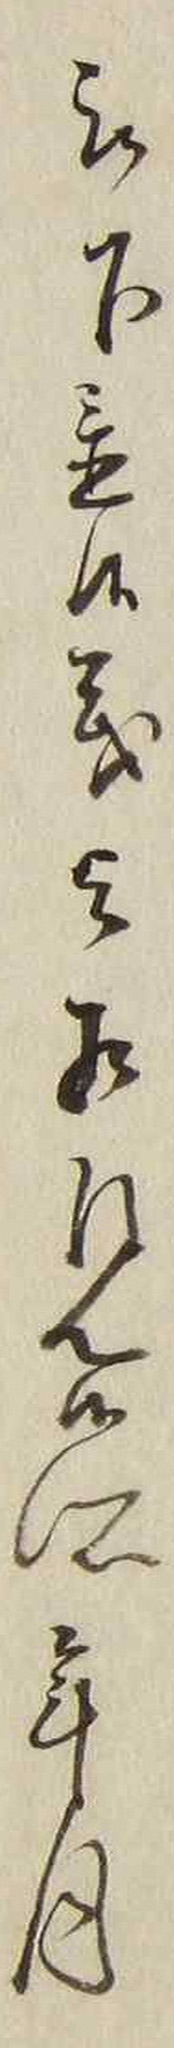被下置候義と相見候所年月

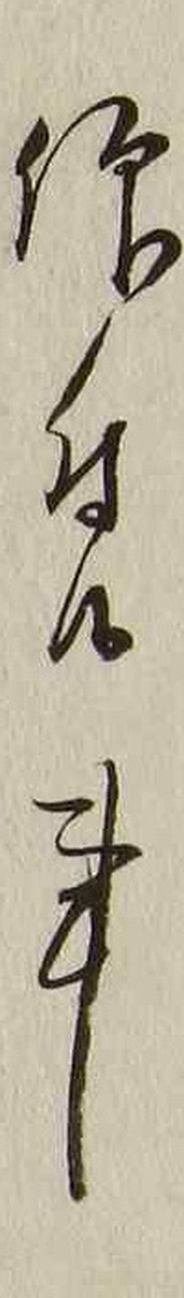仰付候事
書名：諸士系譜　巻之158　ね之部2
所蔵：会津若松市立会津図書館
